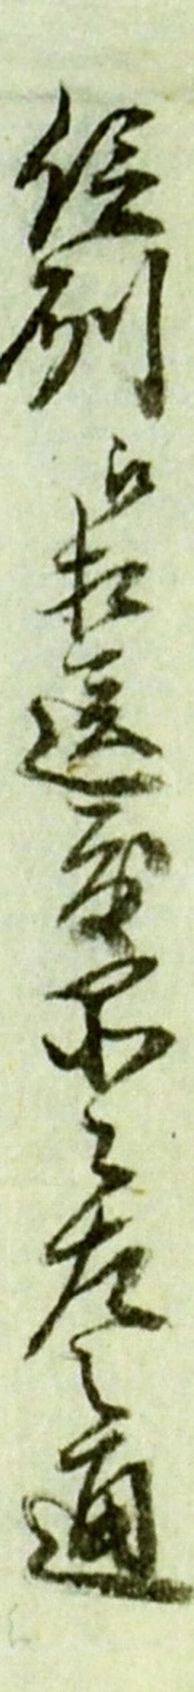信州江相送度品々左之通
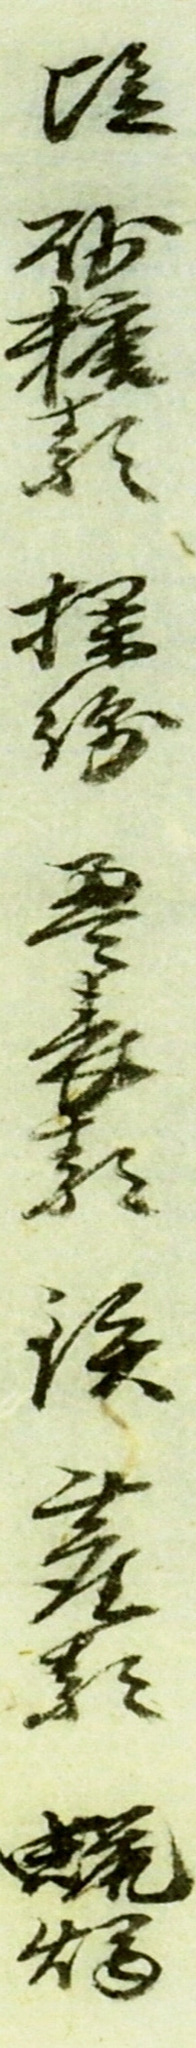塩砂糖類揉綿畳表類鉄蓙類蝋燭
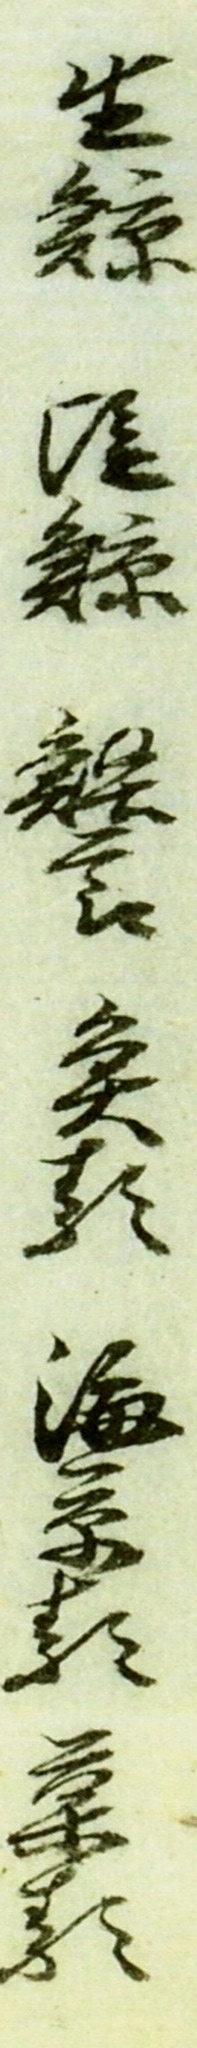生鯨塩鯨鰹節魚類海草類菓類
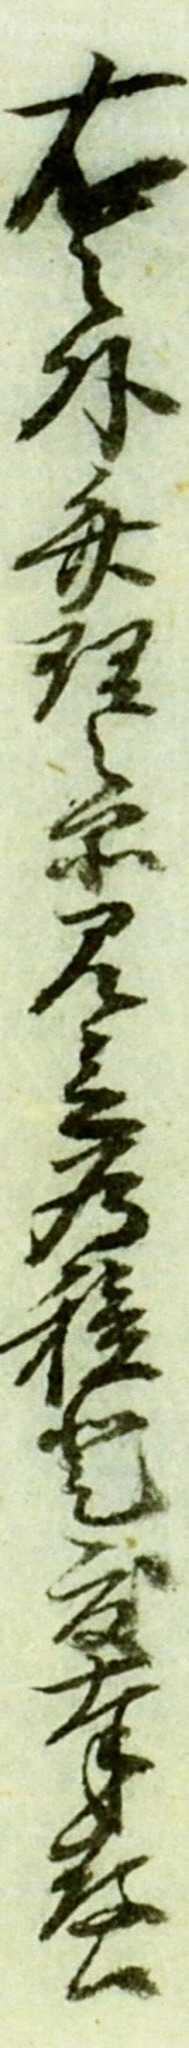右之外弁理之品見立為積登度奉存候
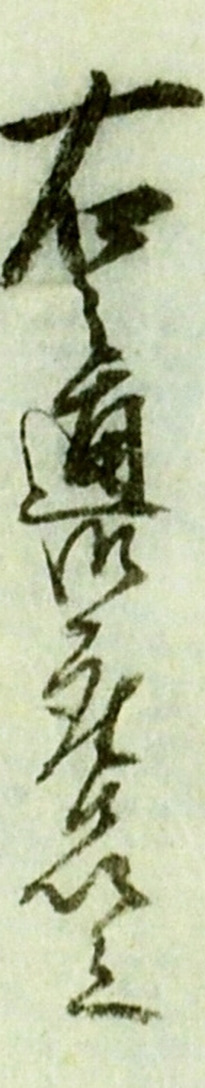右之通御座候以上
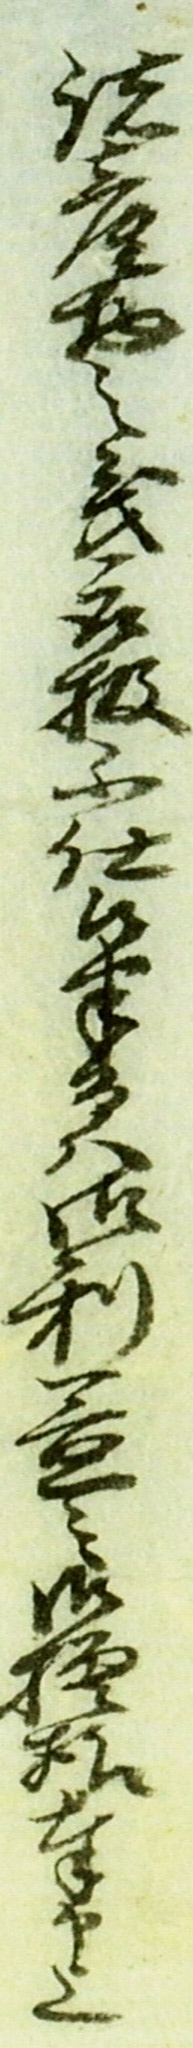諸産物之義取扱不仕候半分ハ御利益之御模様奉申上
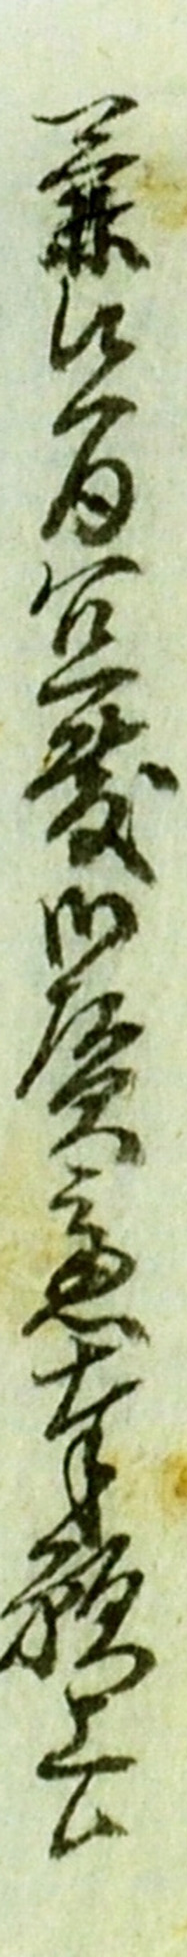兼候間宜敷御賢慮奉願上候
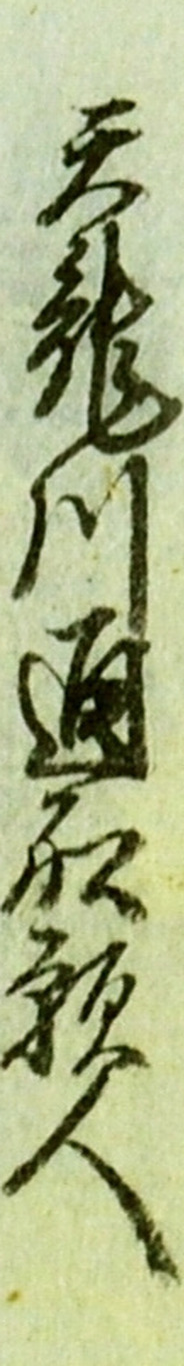天龍川通船願人
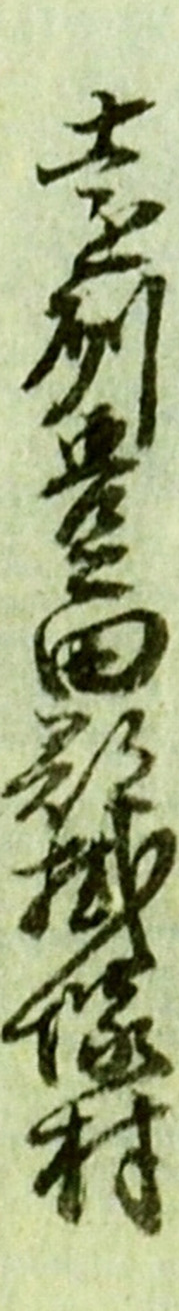遠州豊田郡掛塚村
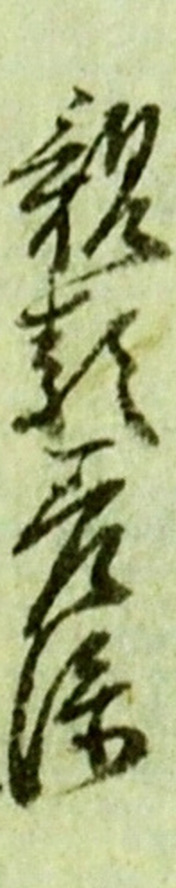親類差添
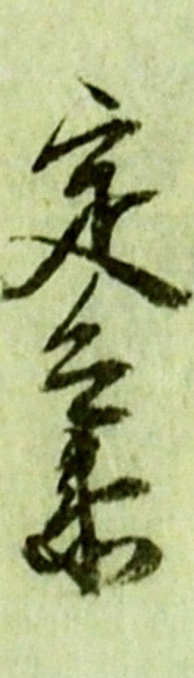定兵衛
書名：乍恐以書付奉願上候
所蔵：伊那市立高遠町図書館・合同会社AMANE
